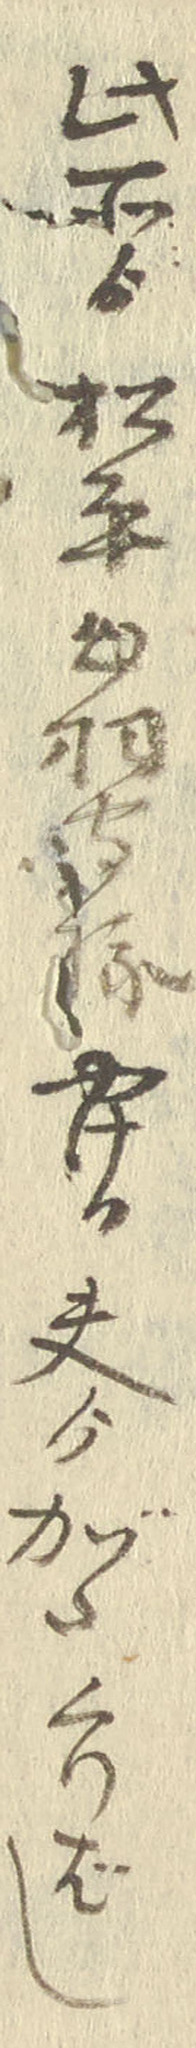此所ゟ松平出羽守様やける夫ゟがたくりばし
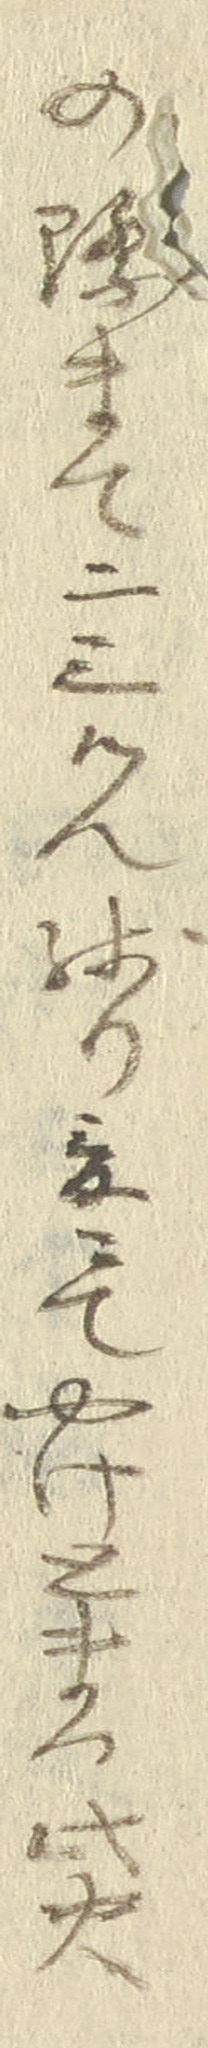の際まて二三けん残り爰ニてやけとまる此火
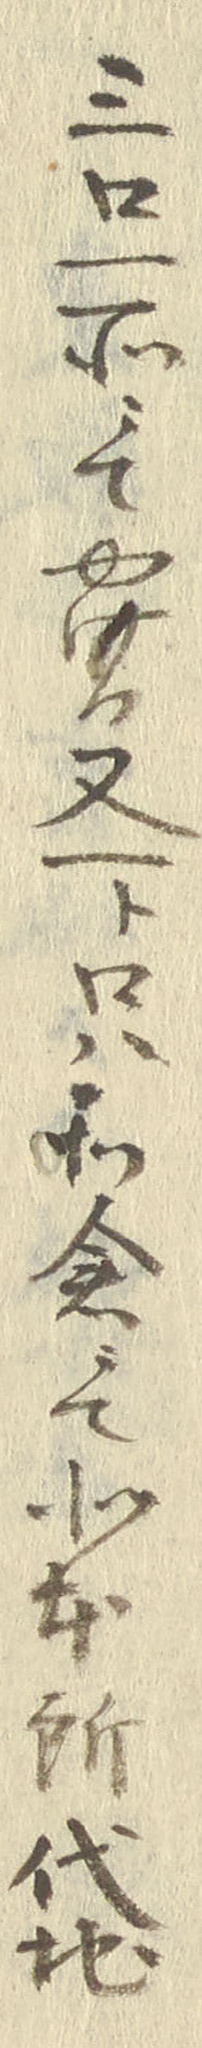三口一所ニてやける又一ト口は和倉ニて北本所代地
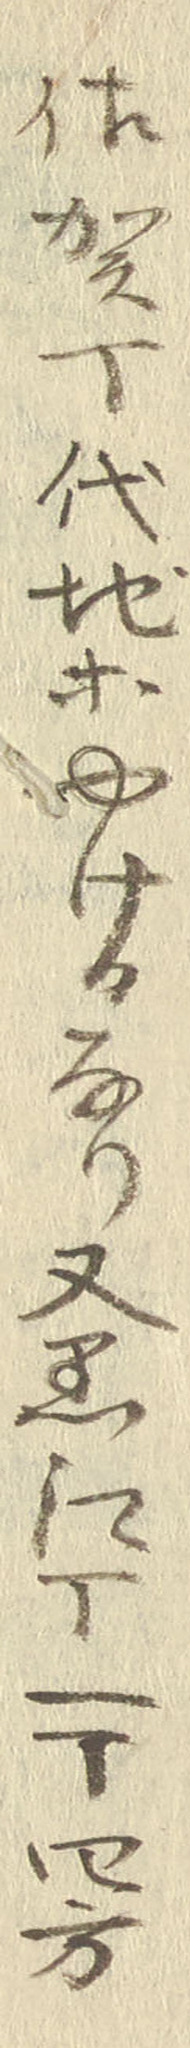佐賀丁代地等やけるなり又黒江丁一丁四方
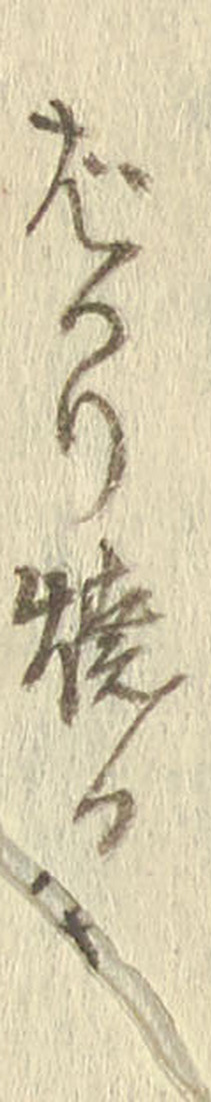ばかり焼る
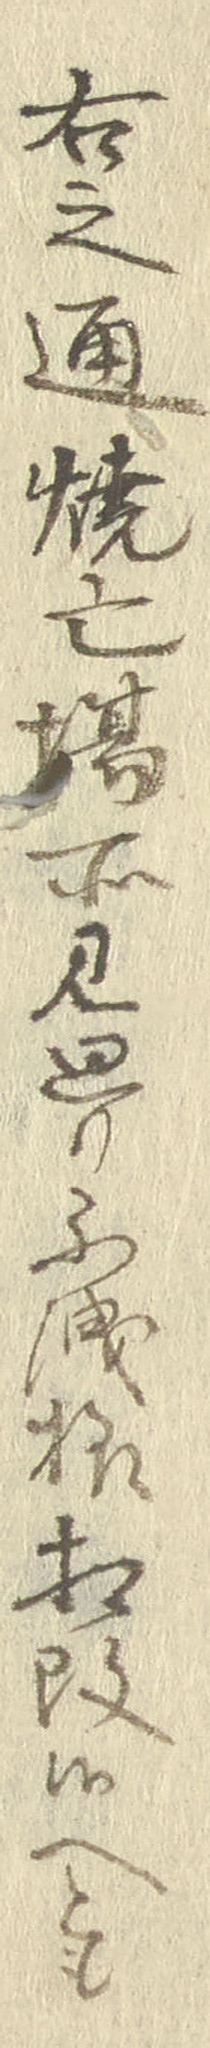右之通焼亡場所見廻り不洩様相改候へとも
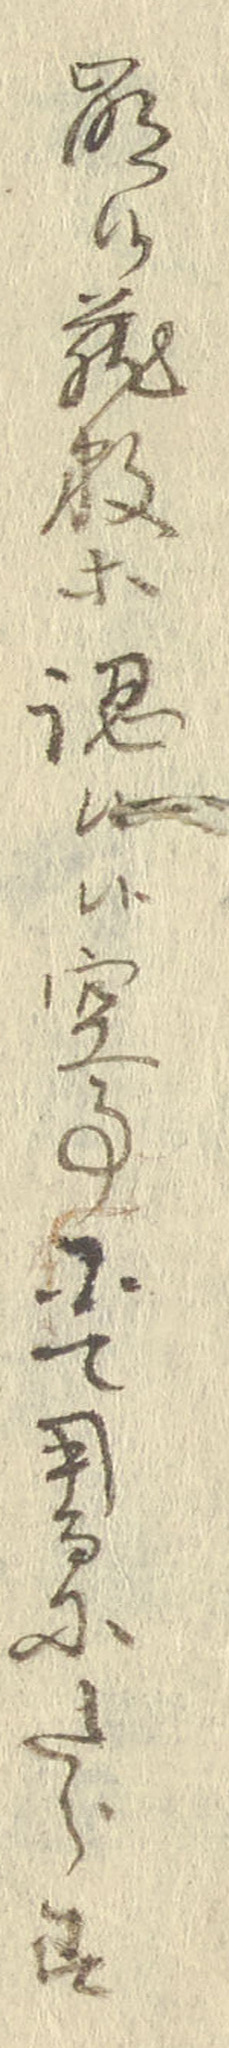崩候蔵数等認候空事にて用るにたらす
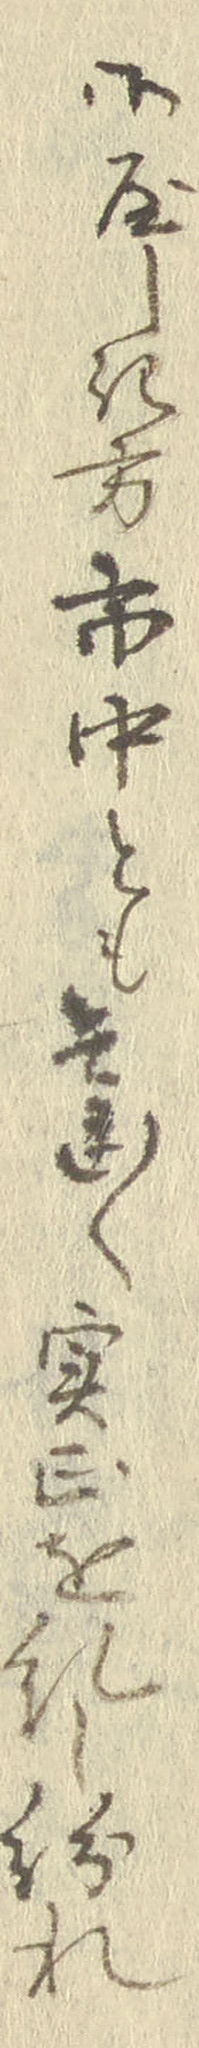御屋しき方市中ともそれ〳〵実正を糺し紛れ
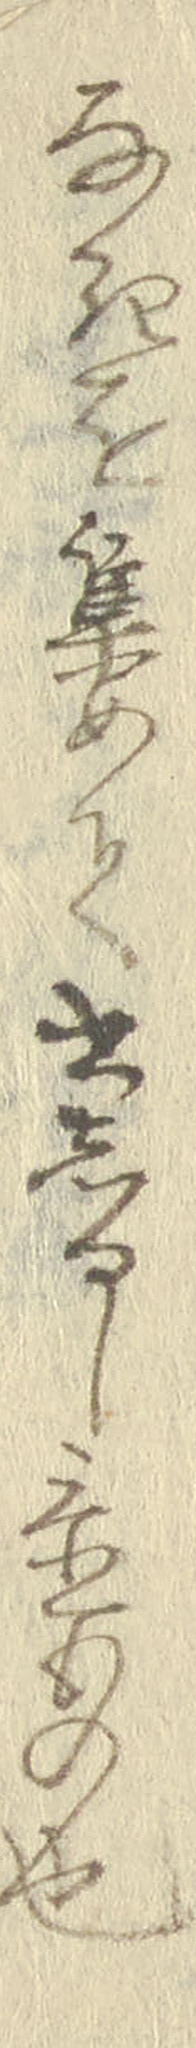なきを集めて書しるし置もの也

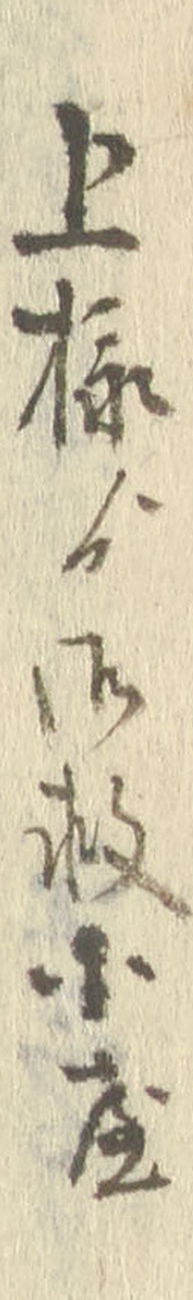上様ゟ御救小屋
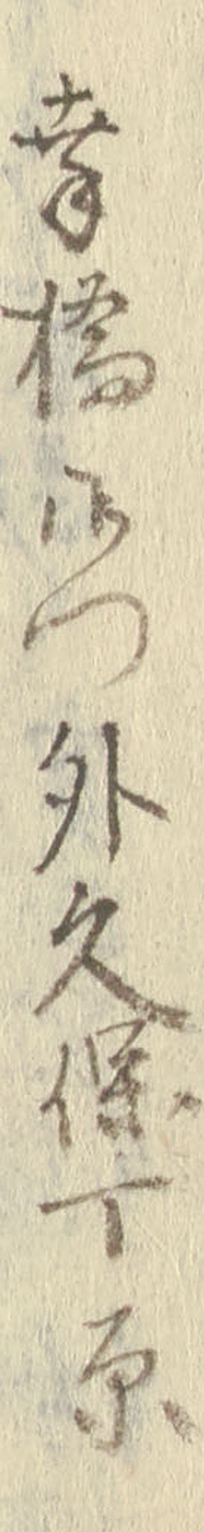幸橋御門外久保丁原
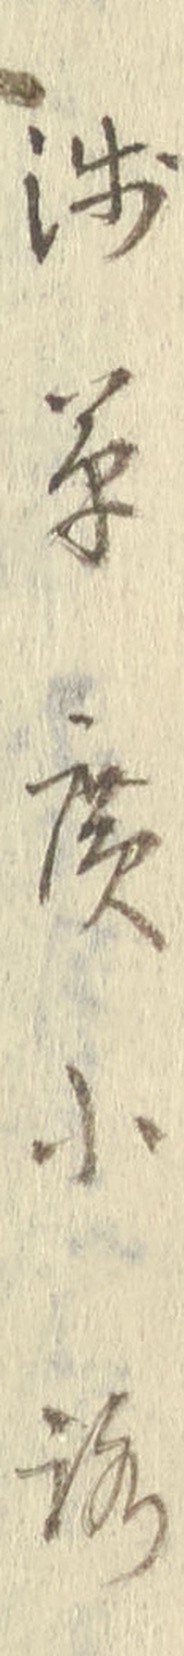浅草廣小路
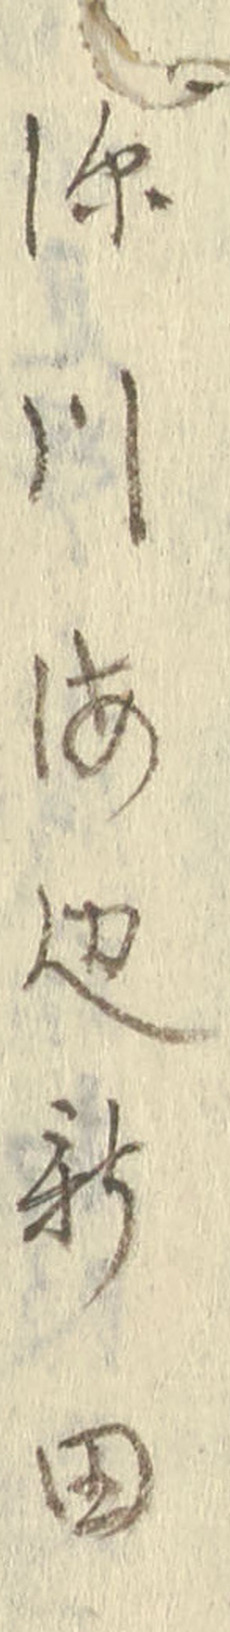深川海辺新田
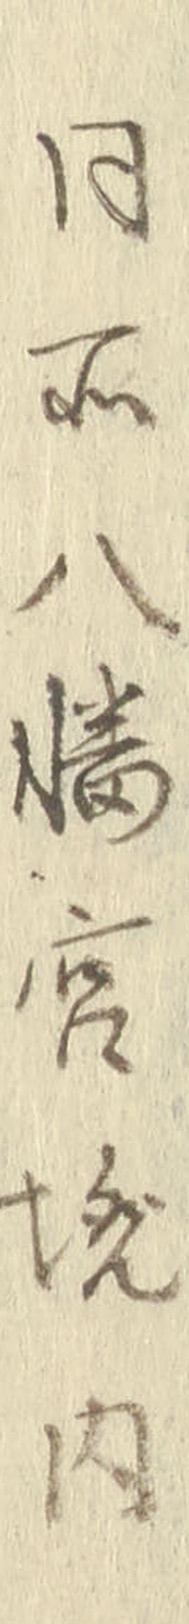同所八幡宮境内
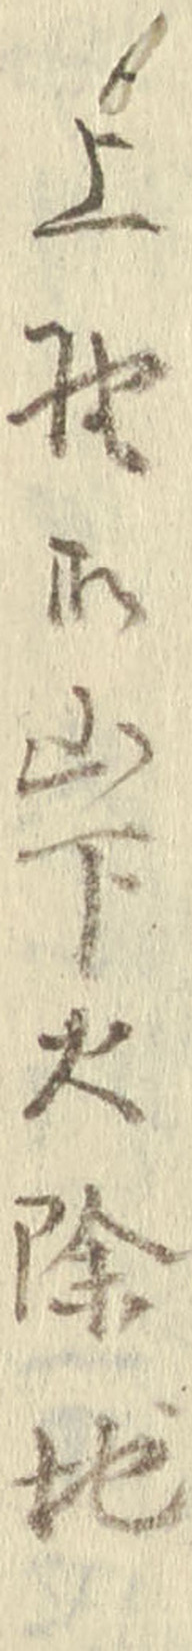上野御山下火除地
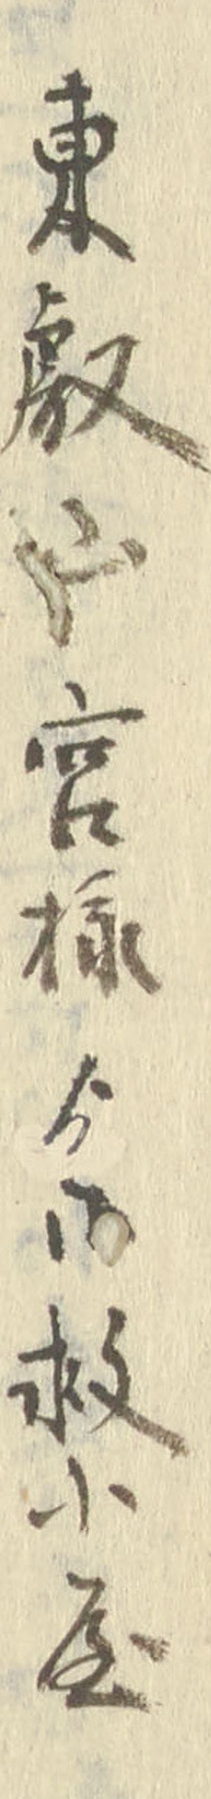東叡山宮様ゟ御救小屋
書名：御府内御屋敷方市中共地震類焼場所明細書之冩兼街道筋近郷聞書
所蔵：東京大学総合図書館 General Library in the University of Tokyo, JAPAN
